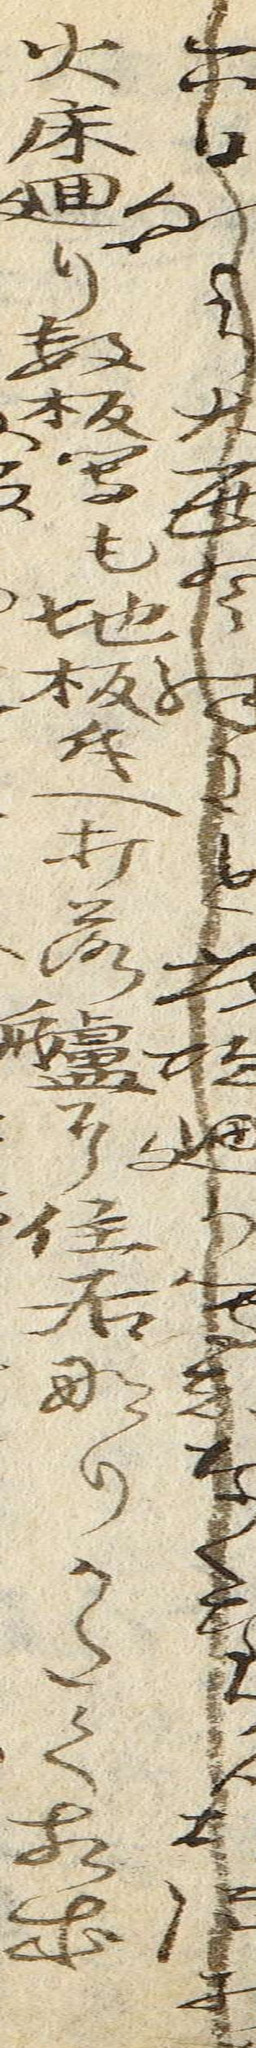火床廻り数板等も地板付へ打落艫に住居なりかたく相成
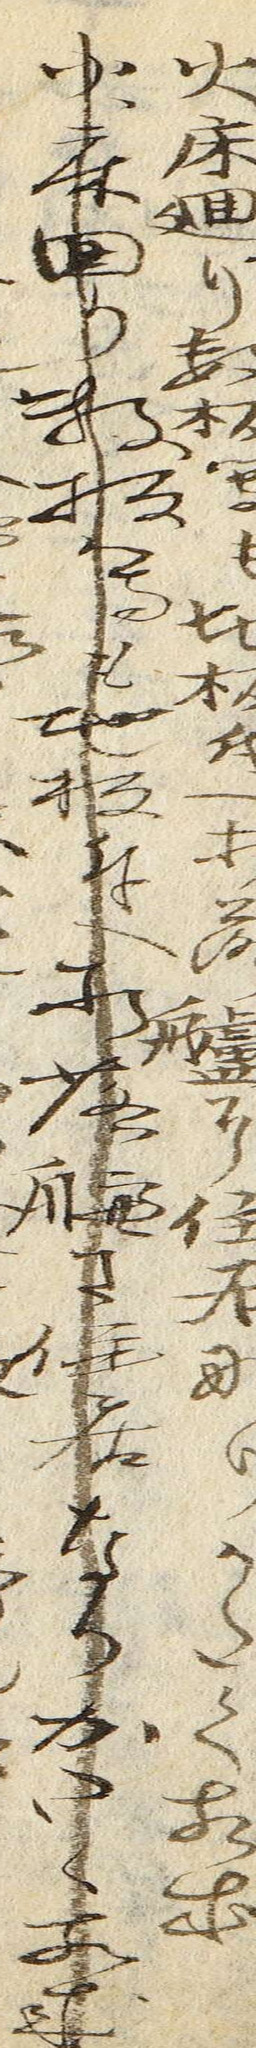火床廻り数板等も地板付へ打落艫に住居なりかたく相成
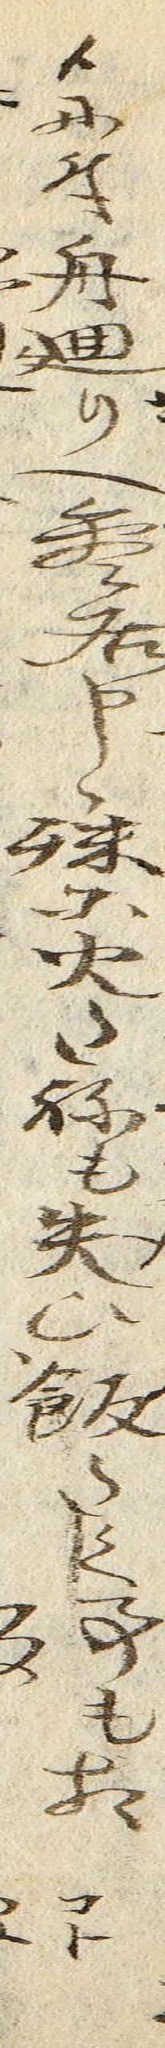候に付舟廻りへ参居申候殊に火たねも失ひ飯たく事も相
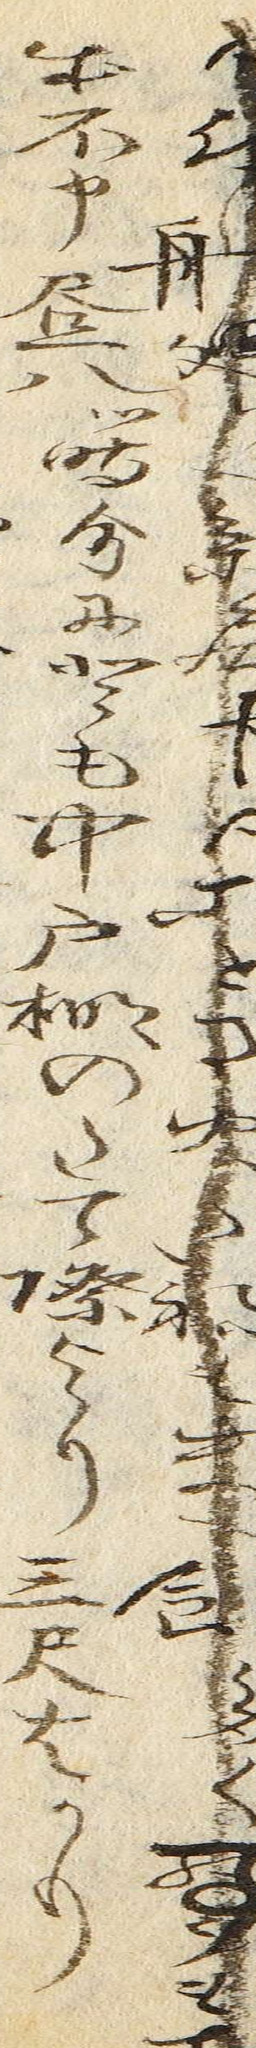成不申昼八ツ時分にとも中戸棚のたて際より三尺はかり
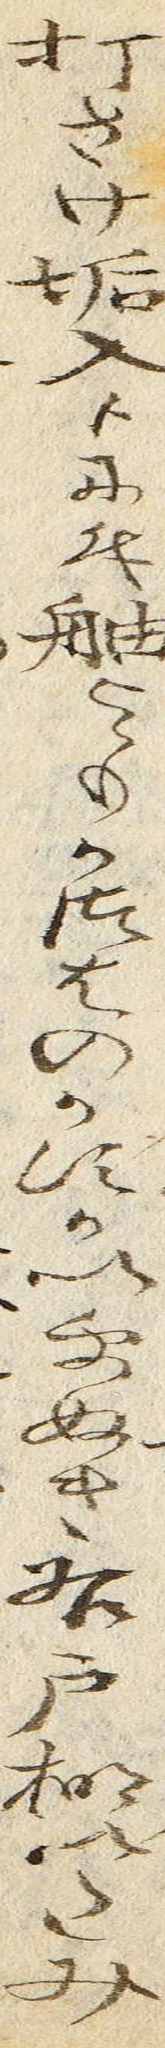打さけ垢入候に付字舳よりかつはのかすがいをぬき右戸棚いたみ
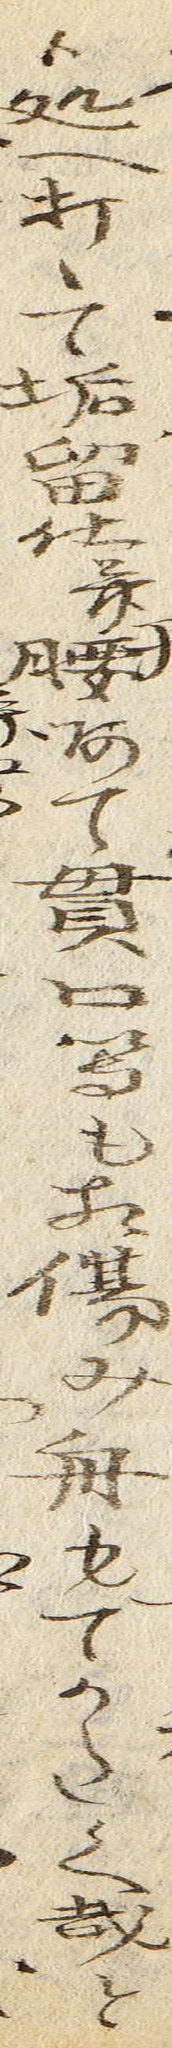候処へ打候て垢留仕并腰あて貫口等も相傷み舟もてかたく哉と
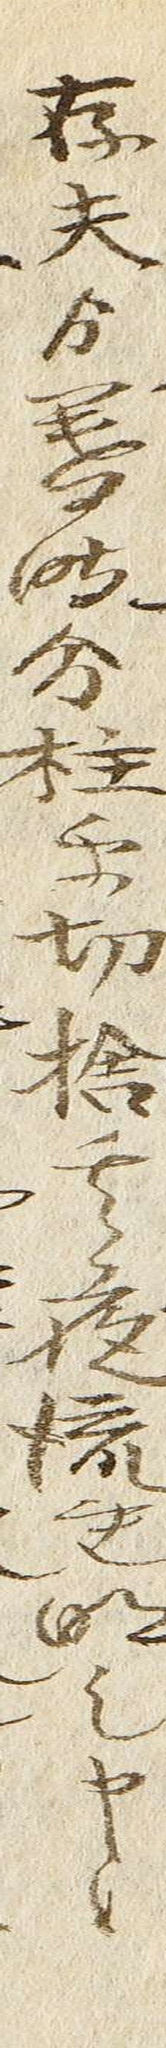存夫ゟ暮時分柱を切捨其夜流れ明し申候
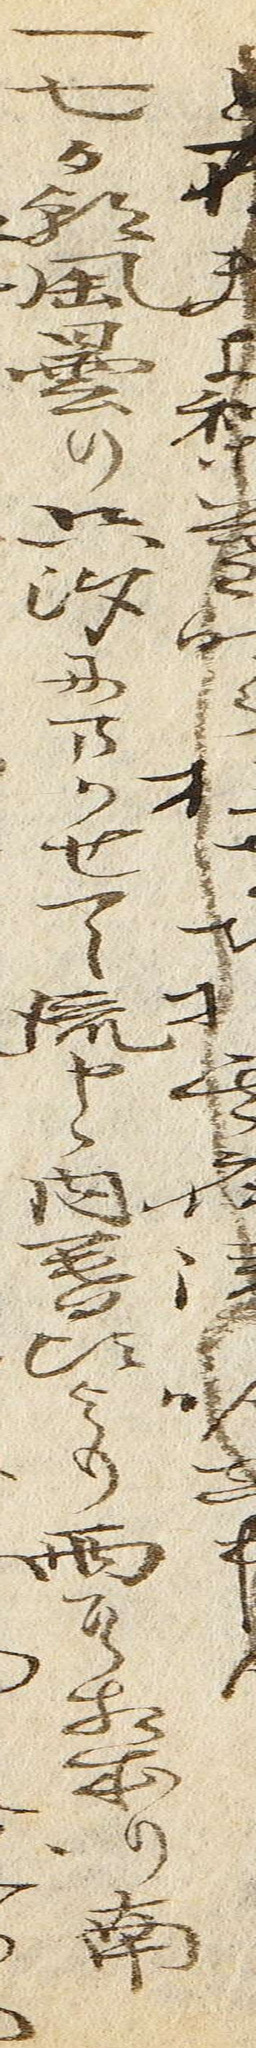一七日朝凪曇り只汐にまかせて流申候内暮頃より雨に相成り南
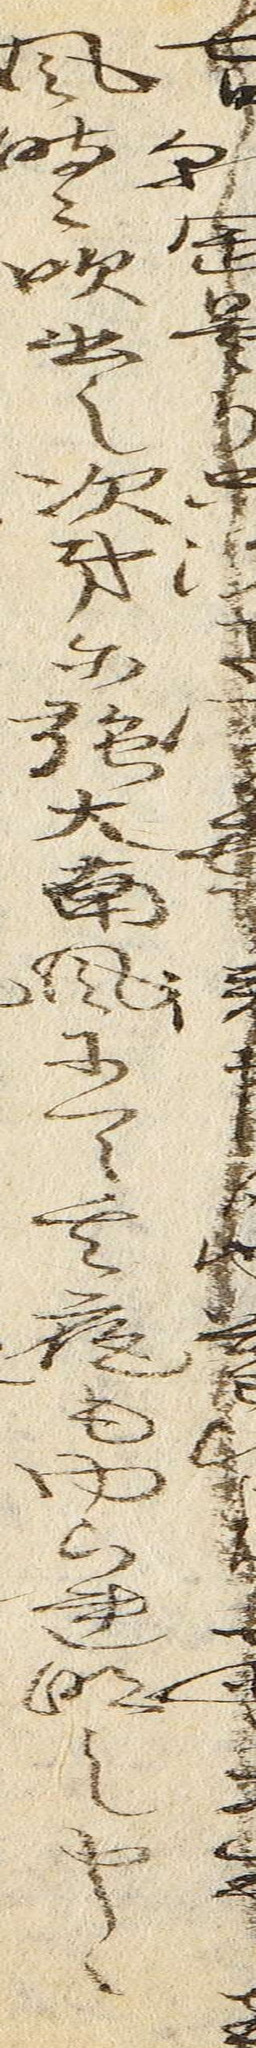風時々吹出し次第に強大南風にて其夜もゆられ明し申候
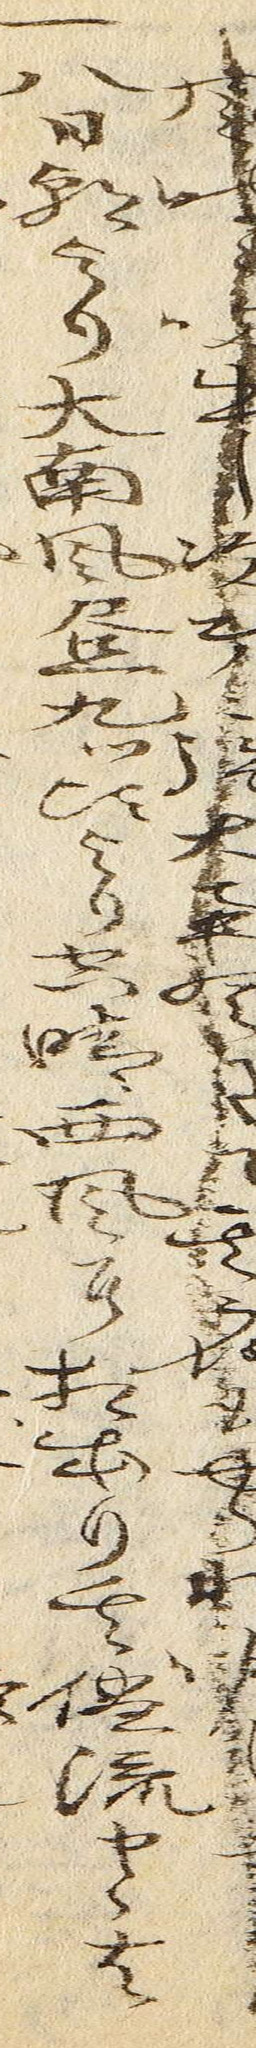一八日朝より大南風昼九ツ頃より空晴西風に相成り其儘流申候は
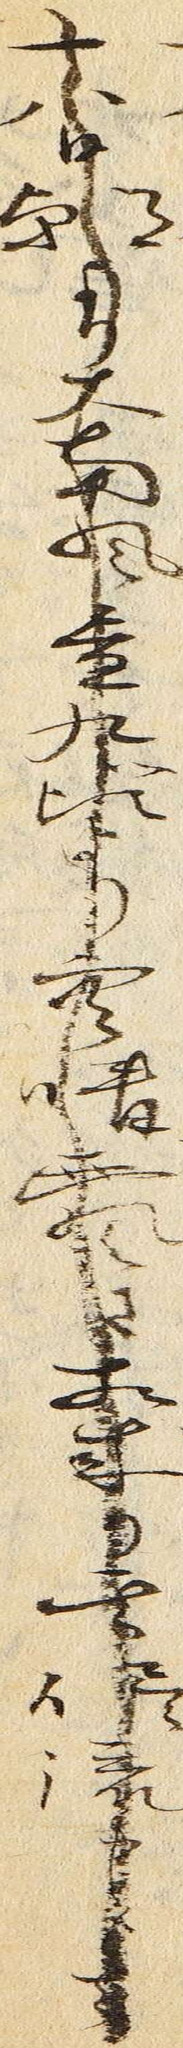一八日朝より大南風昼九ツ頃より空晴西風に相成り其儘流申候は
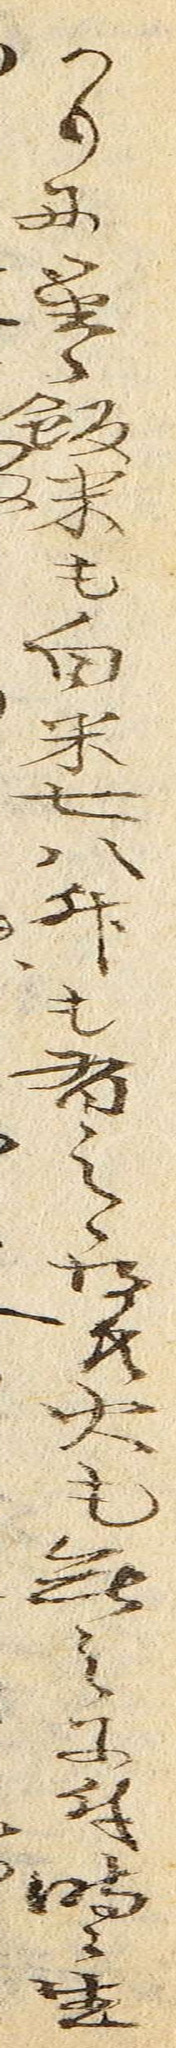かりに御座候飯米も白米七八升も有之候得共火も無之に付時々生
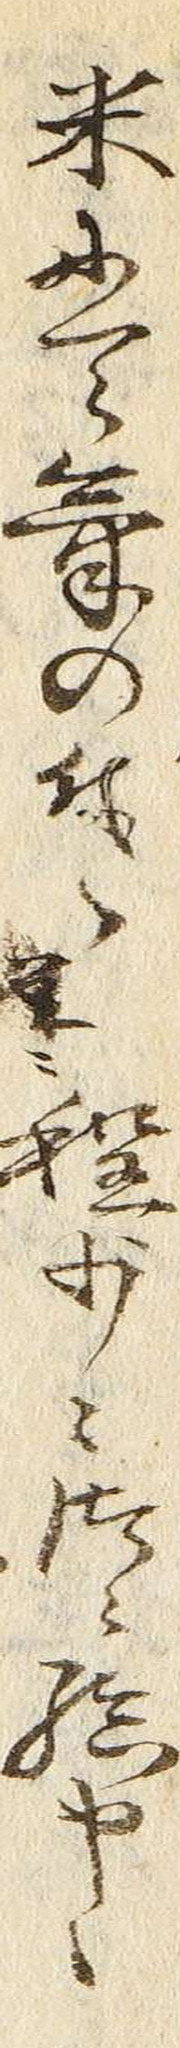米にて気の付候程少々つゝ給申候
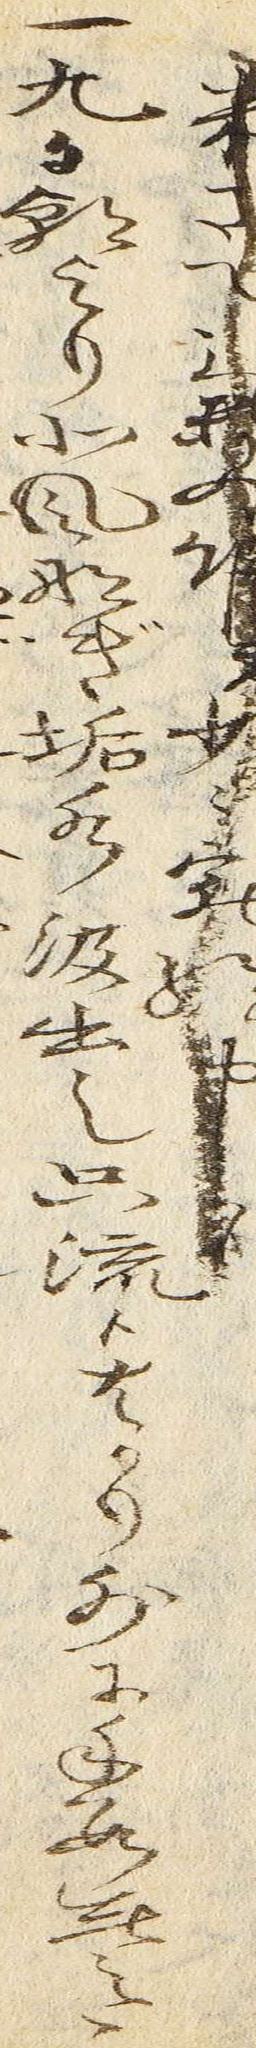一九日朝より北風なぎ垢水汲出し只流候はかり外に手段無之候
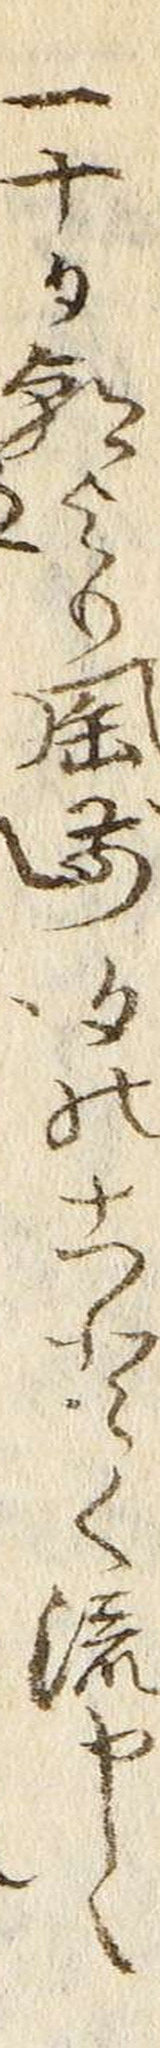一十日朝より凪前日のことく流申候
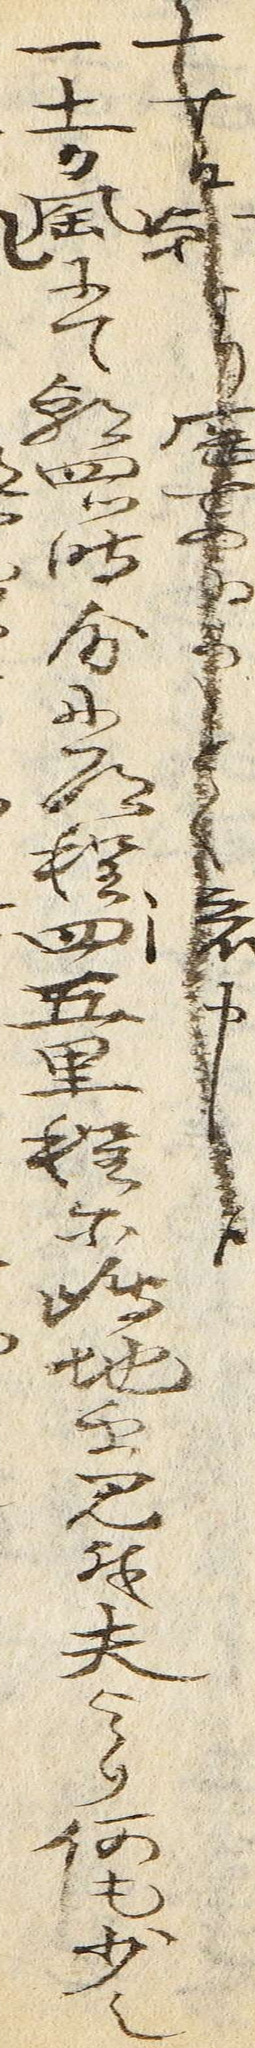一十一日凪にて朝四ツ時分に道程四五里程に嶋地を見付夫より何も少し
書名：無人島漂流書付
